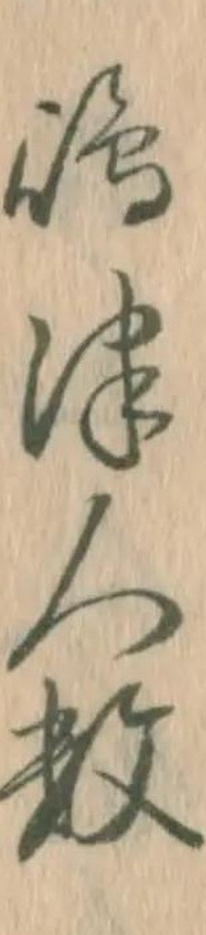島津人数
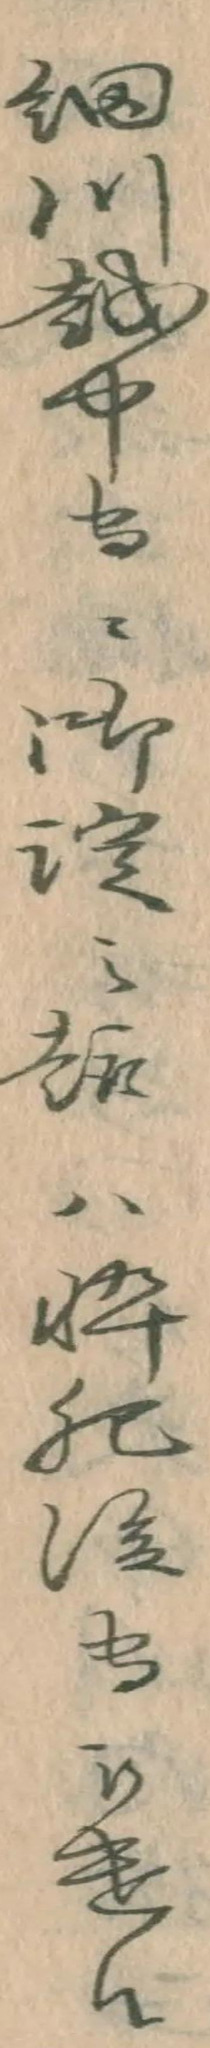一細川越中守に御諚之趣は忰肥後守被遣候
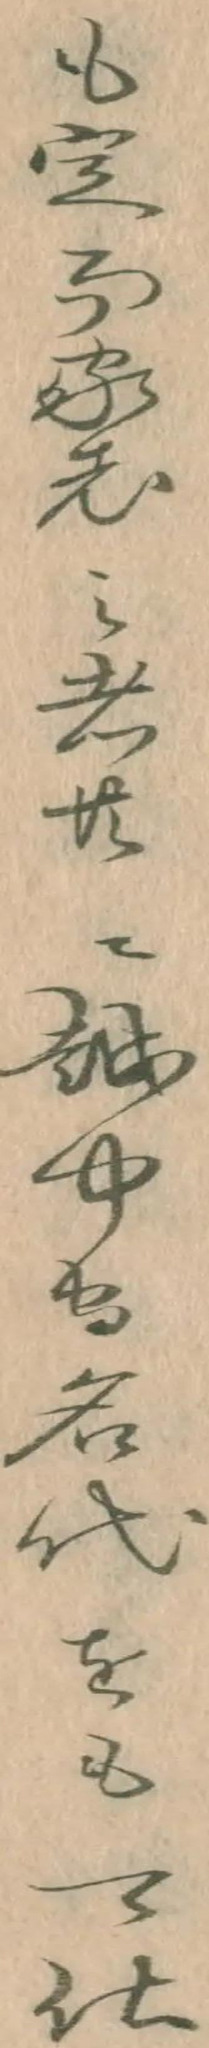も定而家老之者共に越中守名代をも可仕
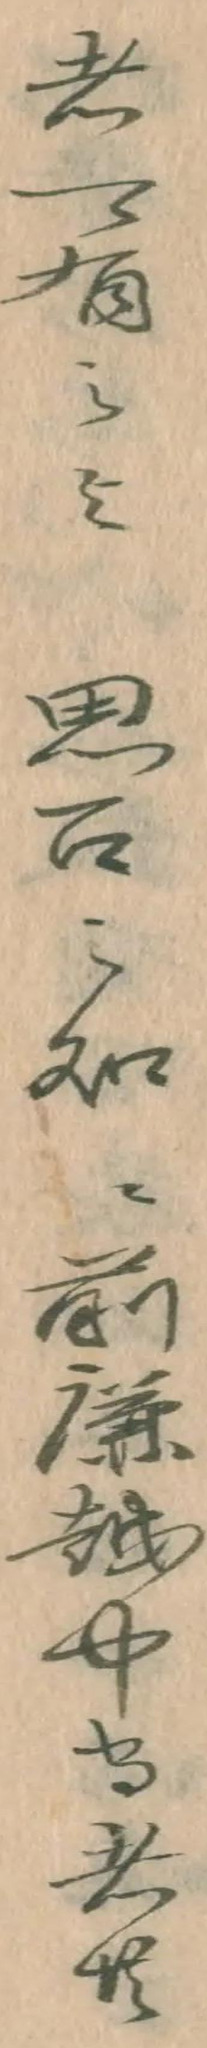者可有之与思召之処に前廉越中守者共
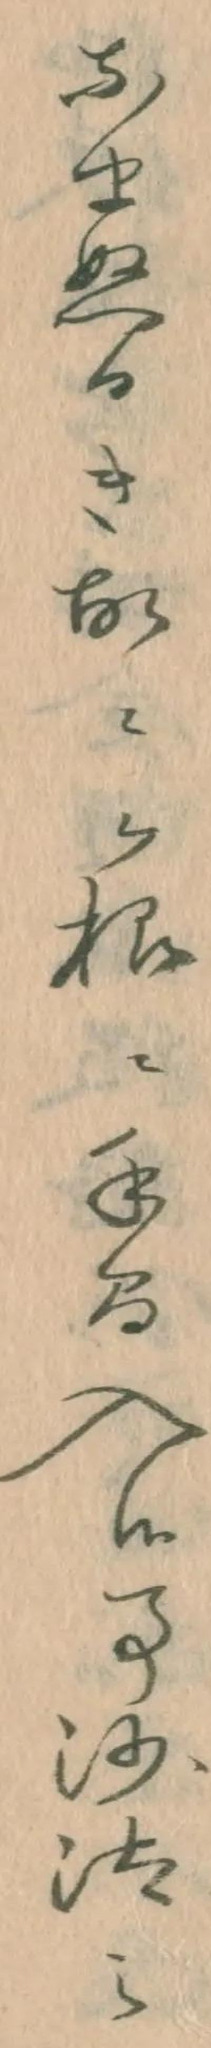なま怒るき故にけ様に手間入候事沙汰之
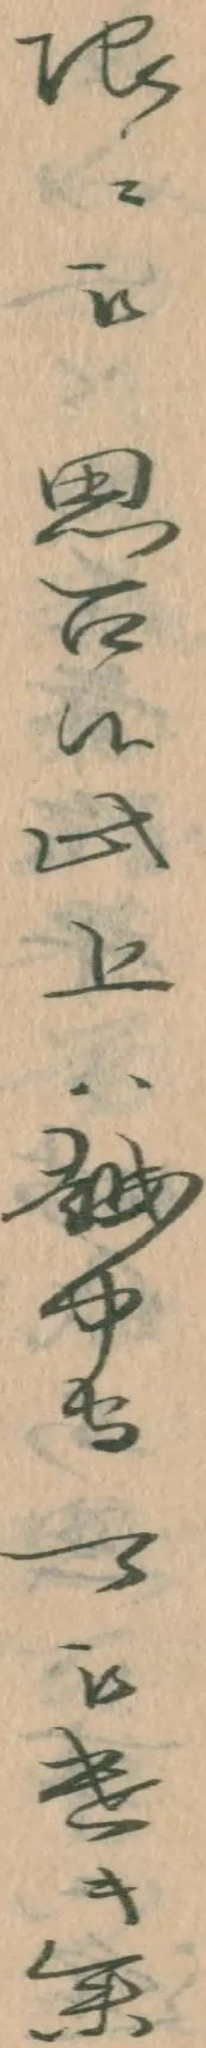限に被思召候此上は越中守可被遣き参
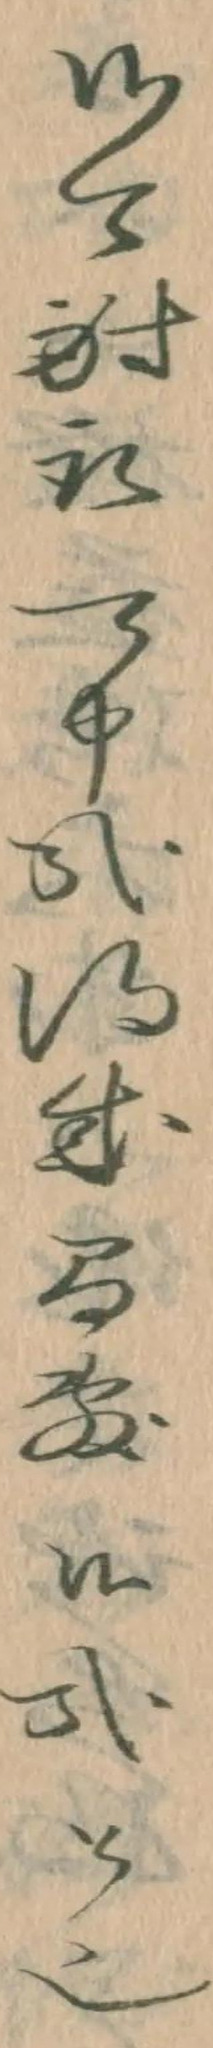候て射取可申哉得成間敷候哉と也
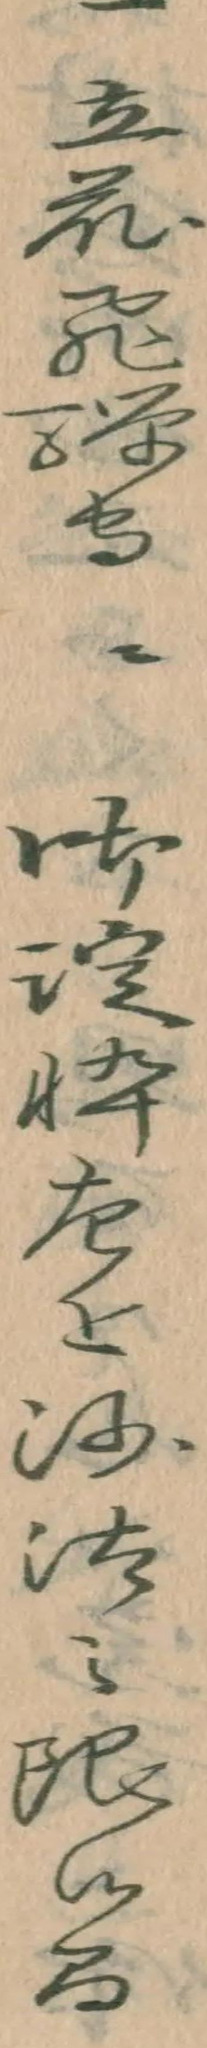一立花飛騨守にも御諚左近沙汰之限候間
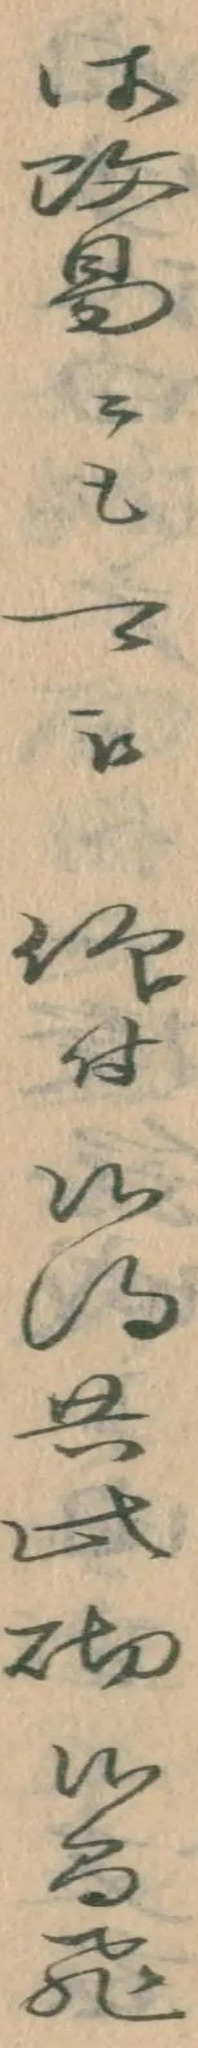御改易にも可被仰付候得共此砌候間飛
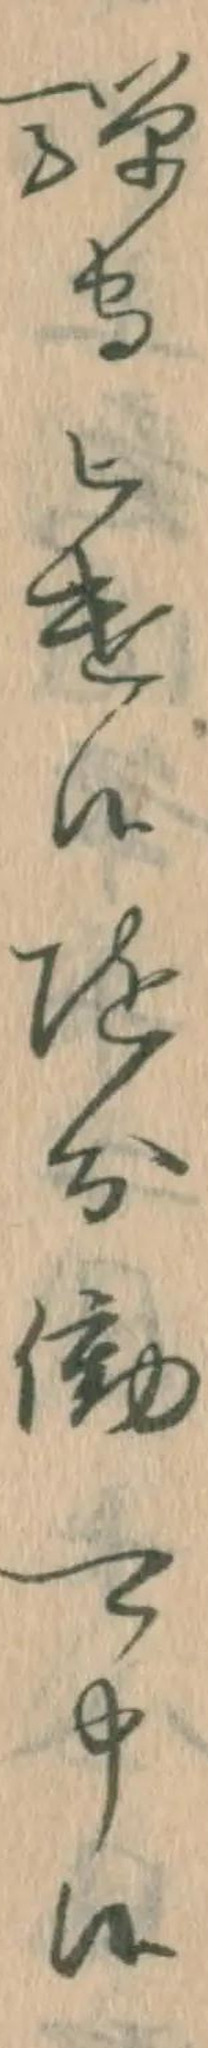騨守被遣候随分働可申候
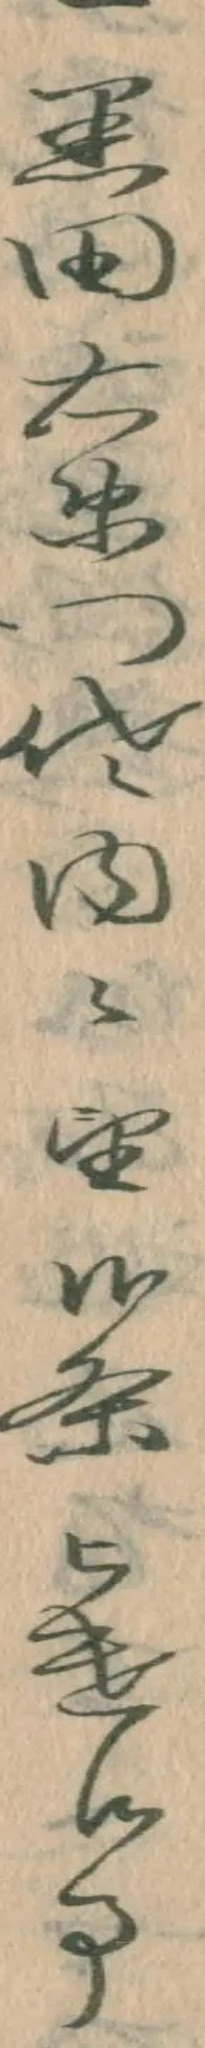一黒田右衛門佐内之望候条与遣候事
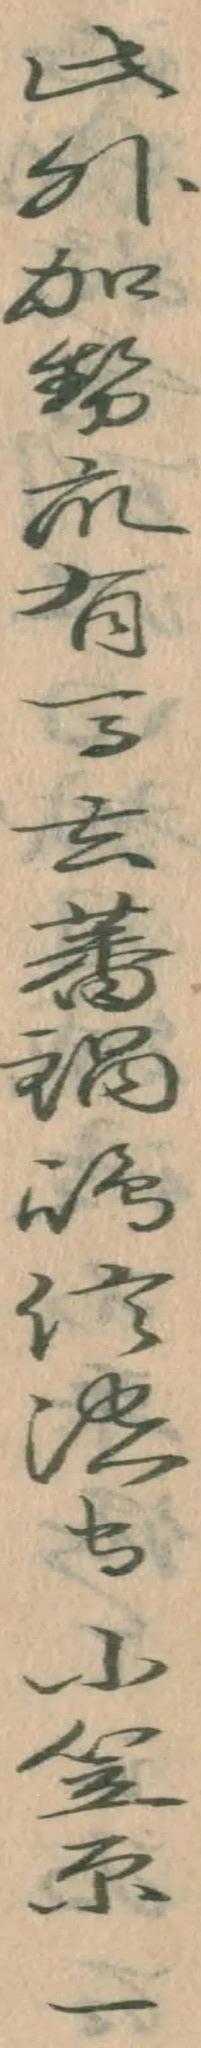此外加勢衆有馬玄蕃鍋島信濃守小笠原一
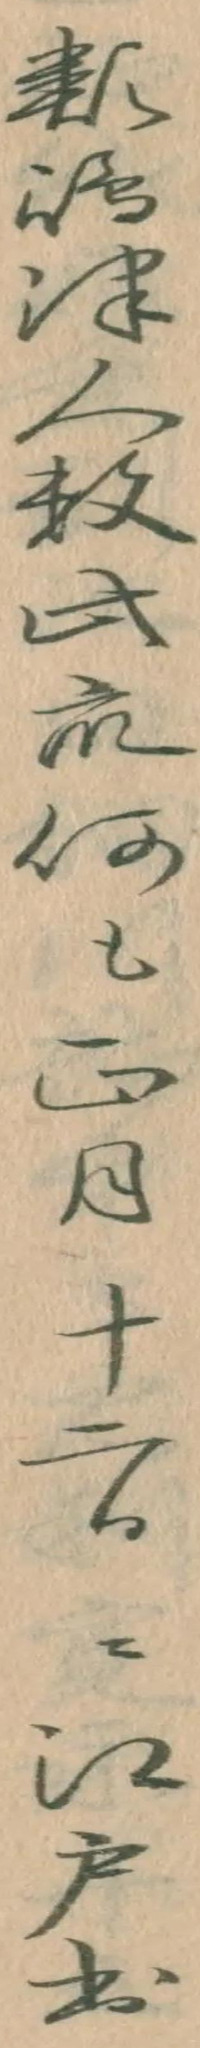類島津人数此衆何も正月十二日に江戸出
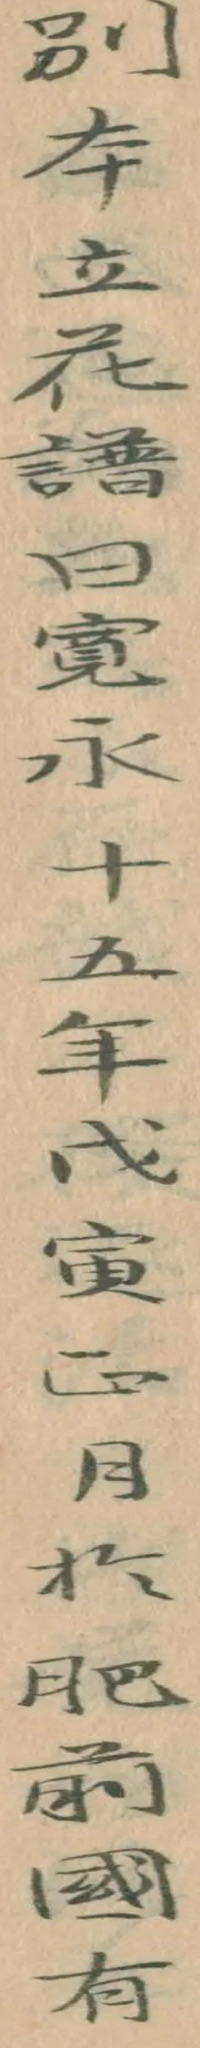別本立花譜曰寛永十五年戌寅正月於肥前国有

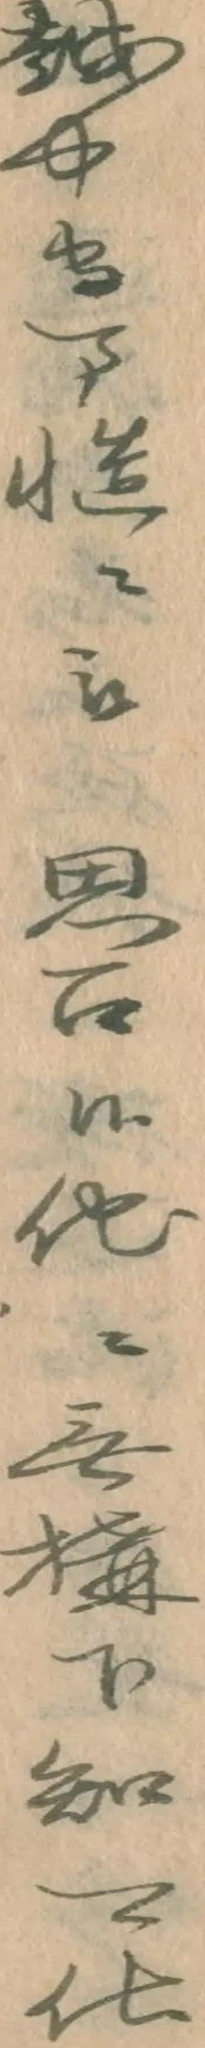越中守事慥に被思召候他に無構下知可仕
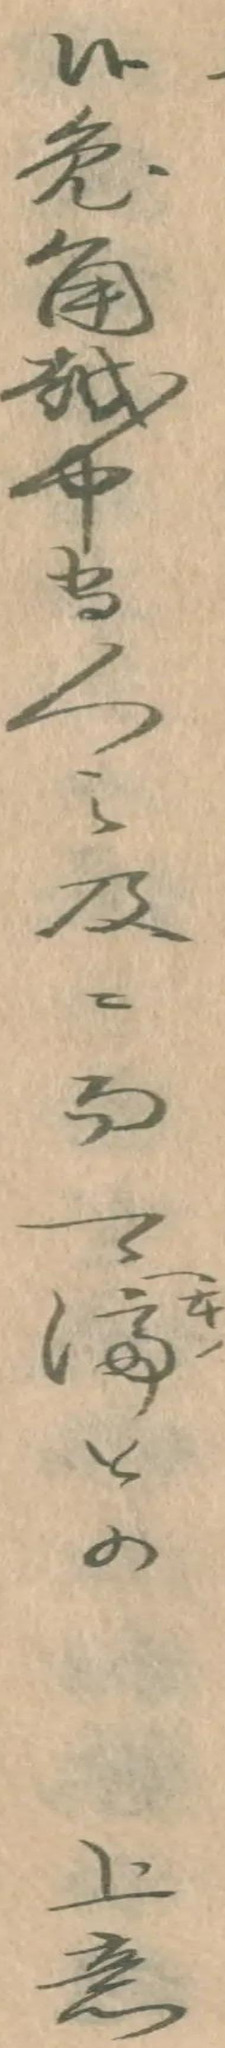候兎角越中守人之及に而可停との上意
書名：切支丹御退治記 49巻. [6]
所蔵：国立国会図書館 National Diet Library, JAPAN
